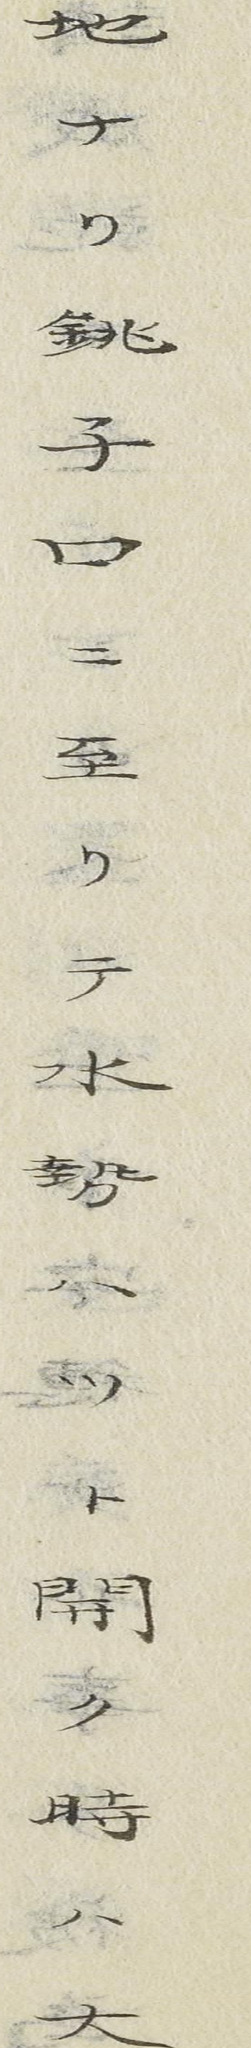地ナリ銚子口ニ至リテ水勢ハツト開ク時ハ大
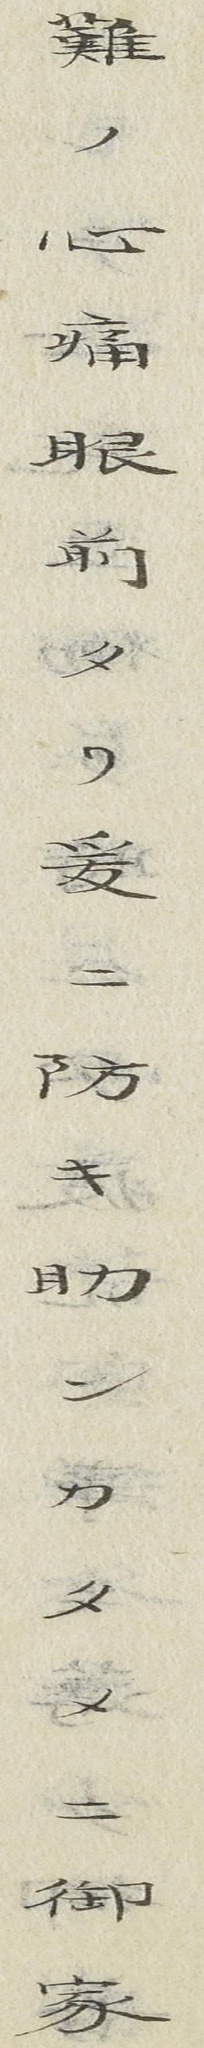難ノ心痛眼前タリ爰ニ防キ助ンカタメニ御家
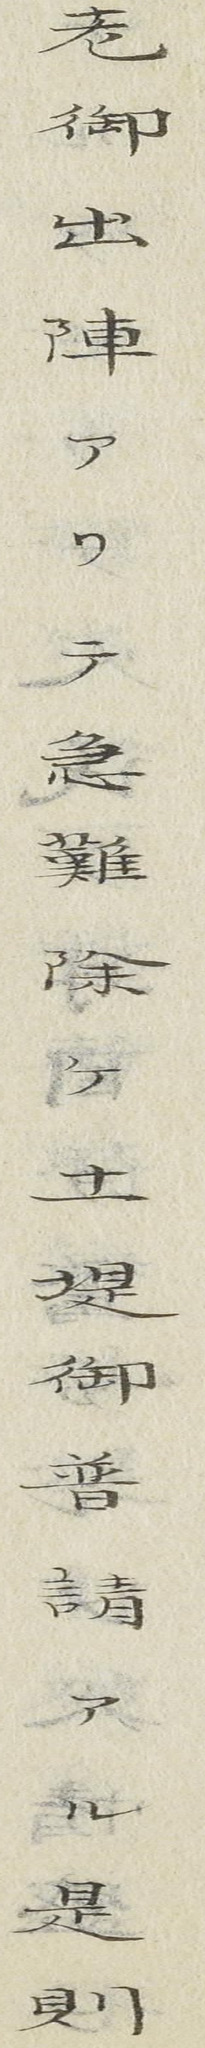老御出陣アリテ急難除ケ土堤御普請アル是則
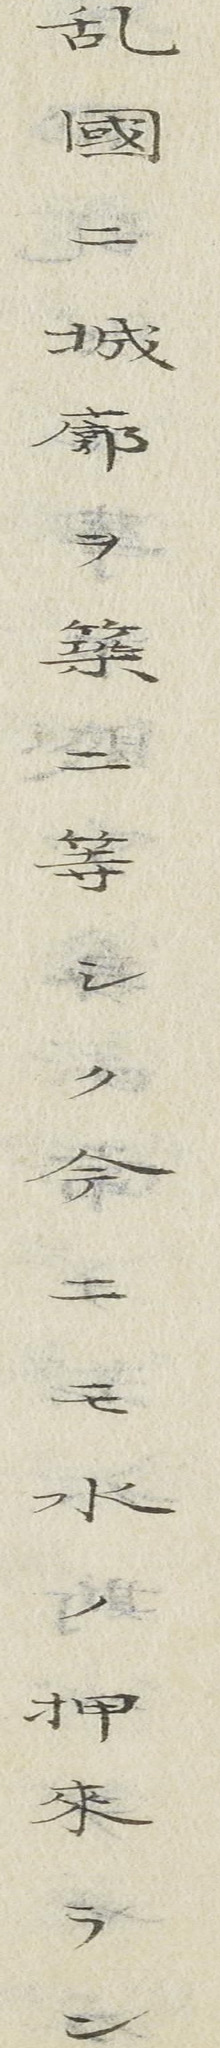乱国ニ城郭ヲ築ニ等シク今ニモ水ノ押来ラン
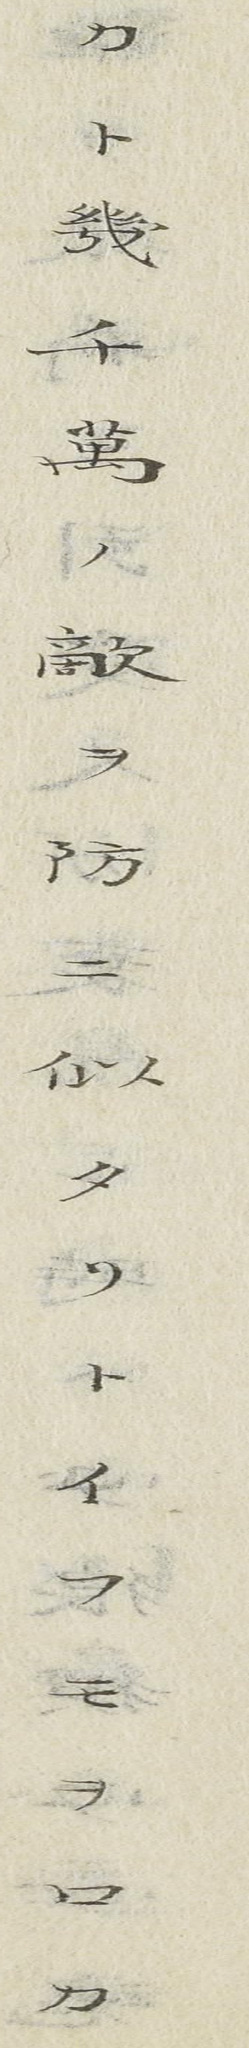カト幾千万ノ敵ヲ防ニ似タリトイフモヲロカ
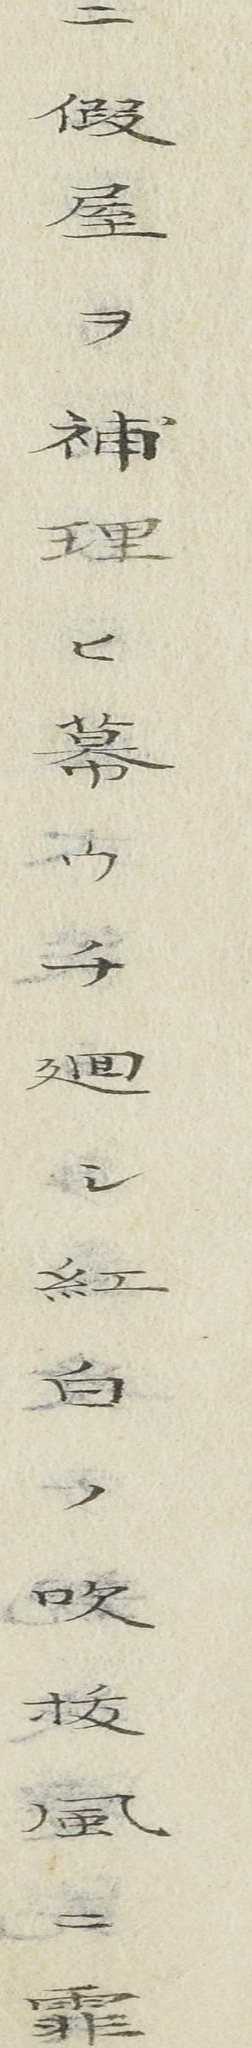ニ仮屋ヲ補理ヒ幕ウチ廻シ紅白ノ吹抜風ニ霏
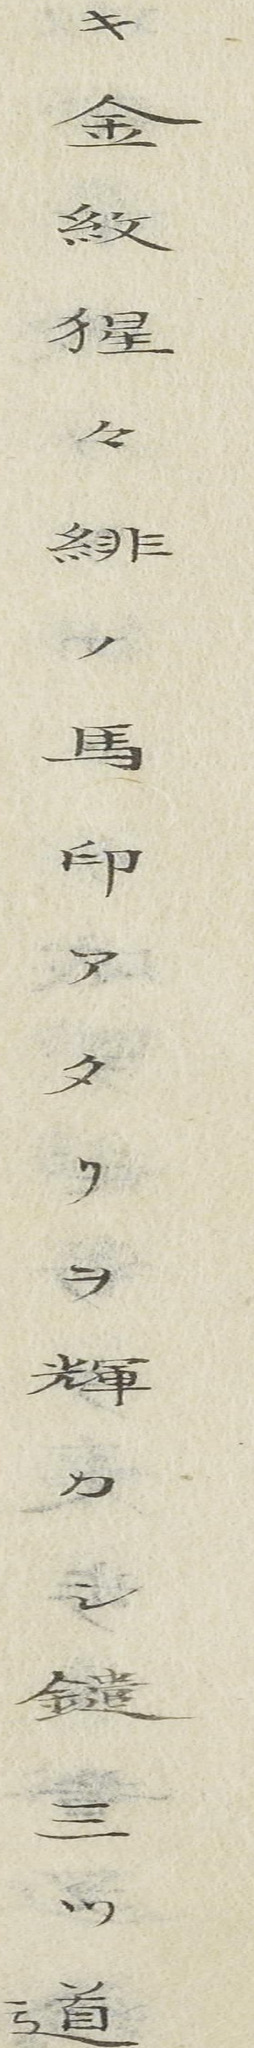キ金紋猩々緋ノ馬印アタリヲ輝カシ鑓三ツ道
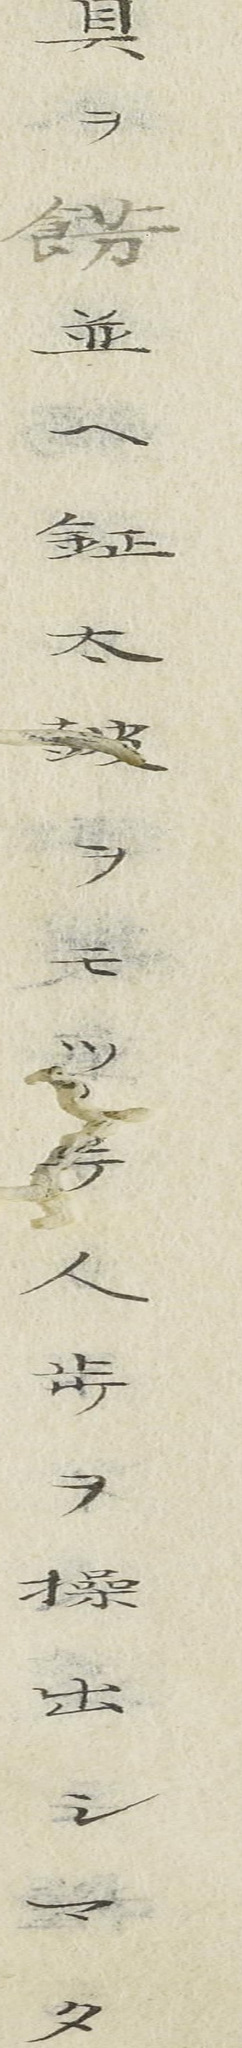具ヲ餝並ヘ鉦太鼓ヲモツテ人歩ヲ操出シマタ

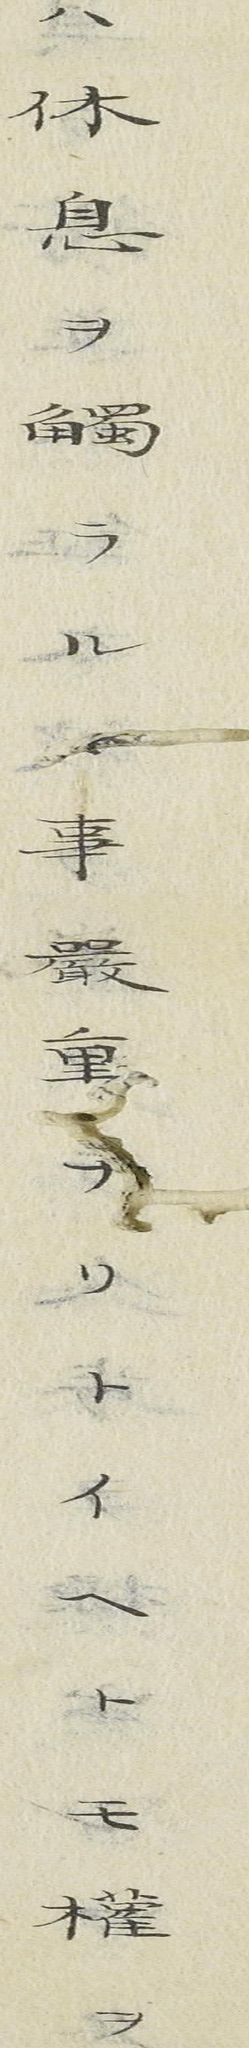ハ休息ヲ触ラルヽ事厳重ナリトイヘトモ権ヲ
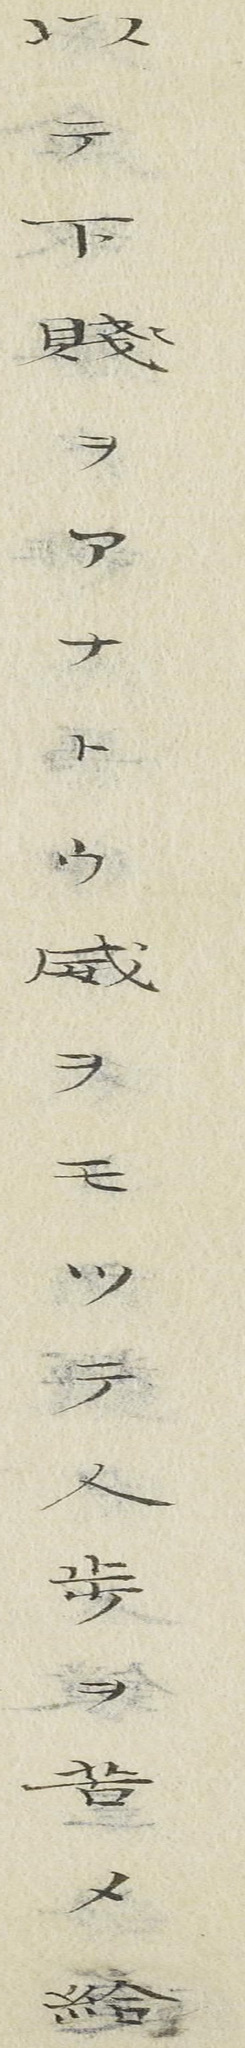以テ下賊ヲアナトウ威ヲモツテ人歩ヲ苦メ給
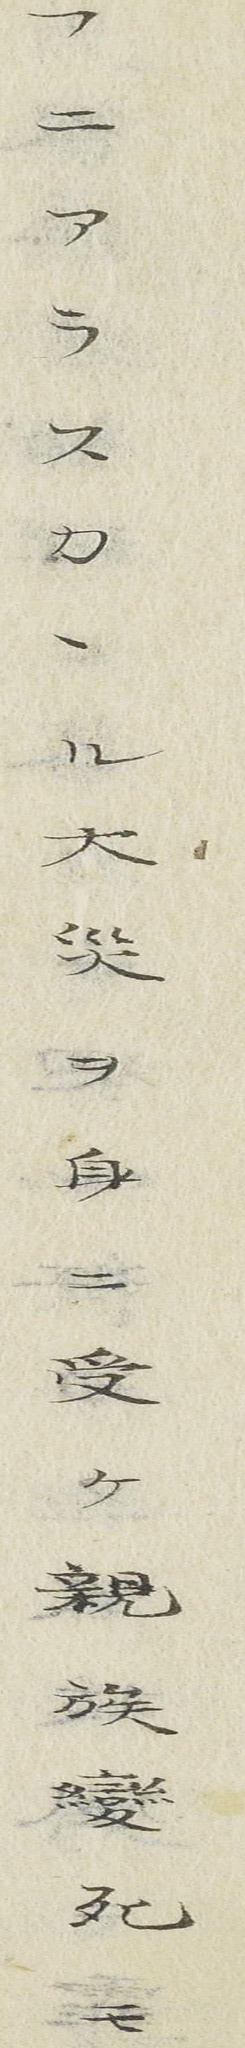フニアラスカヽル大災ヲ身ニ受ケ親族変死モ
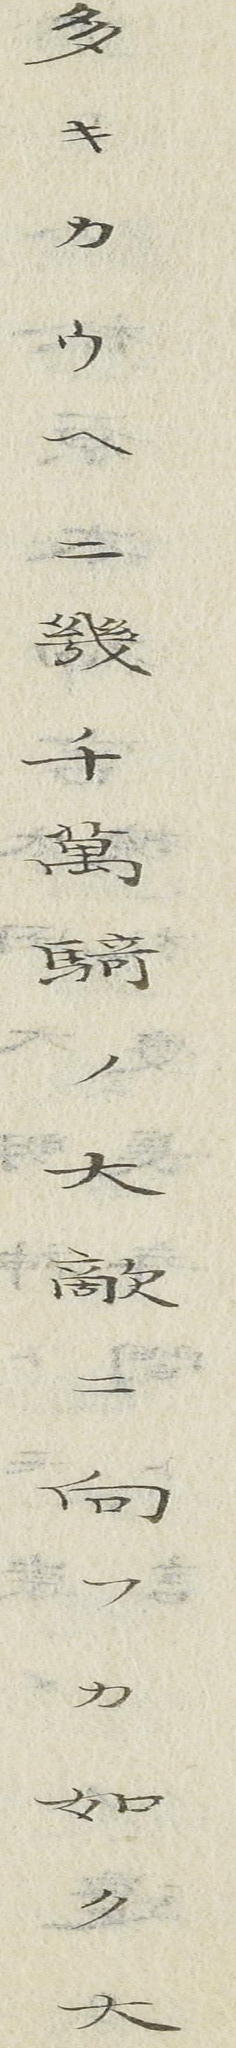多キカウヘニ幾千万騎ノ大敵ニ向フカ如ク大
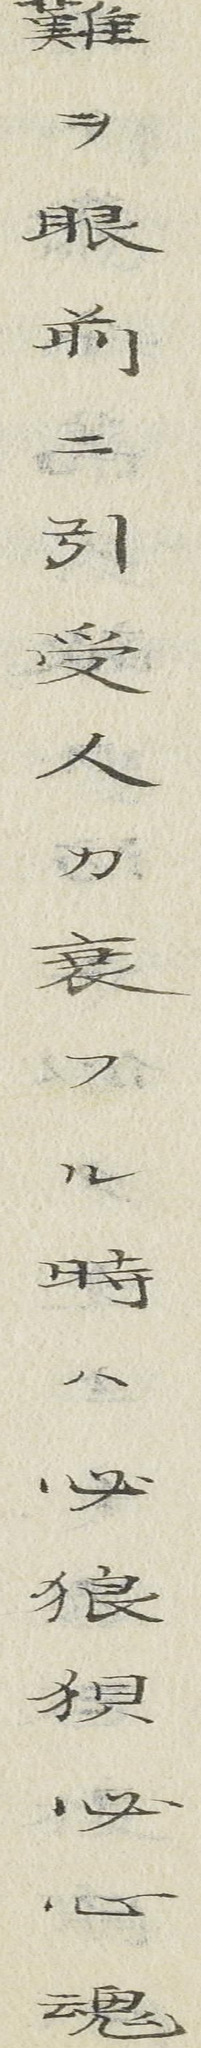難ヲ眼前ニ引受人カ衰フル時ハ必狼狽必心魂
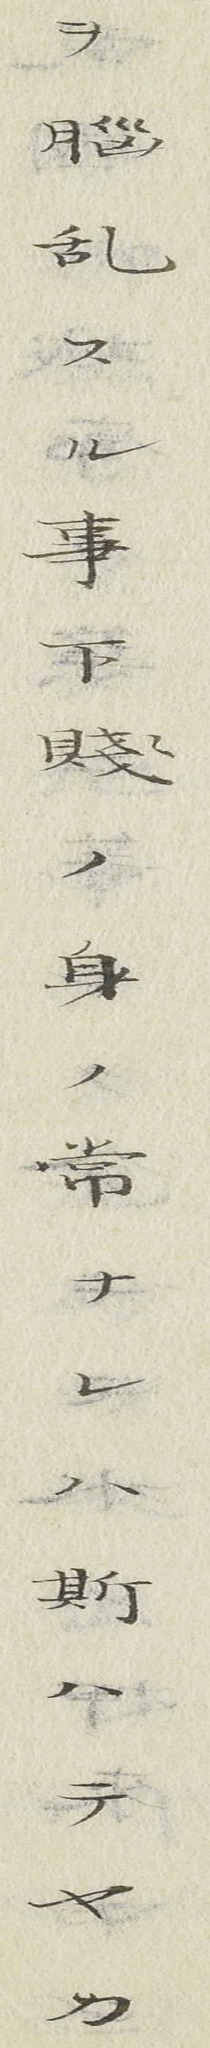ヲ脳乱スル事下賊ノ身ノ常ナレハ斯ハテヤカ
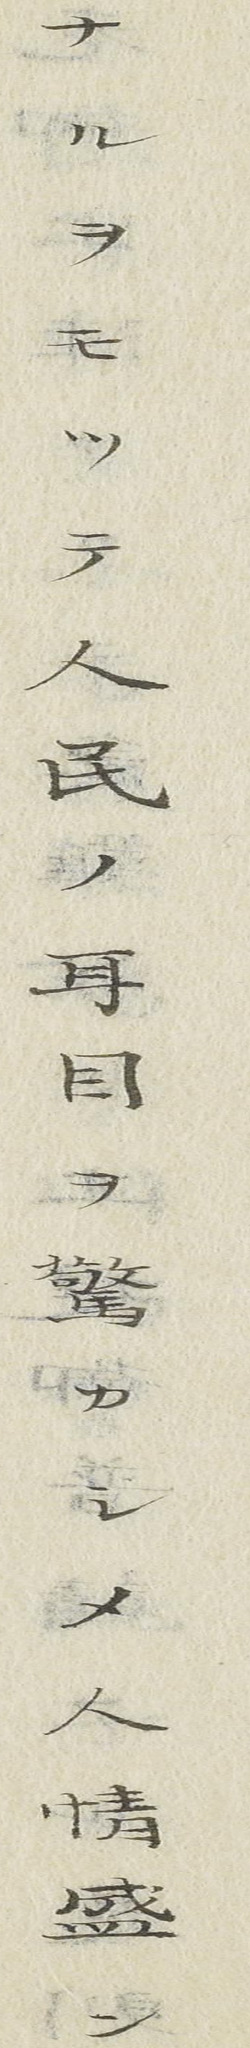ナルヲモツテ人民ノ耳目ヲ驚カシメ人情盛ン
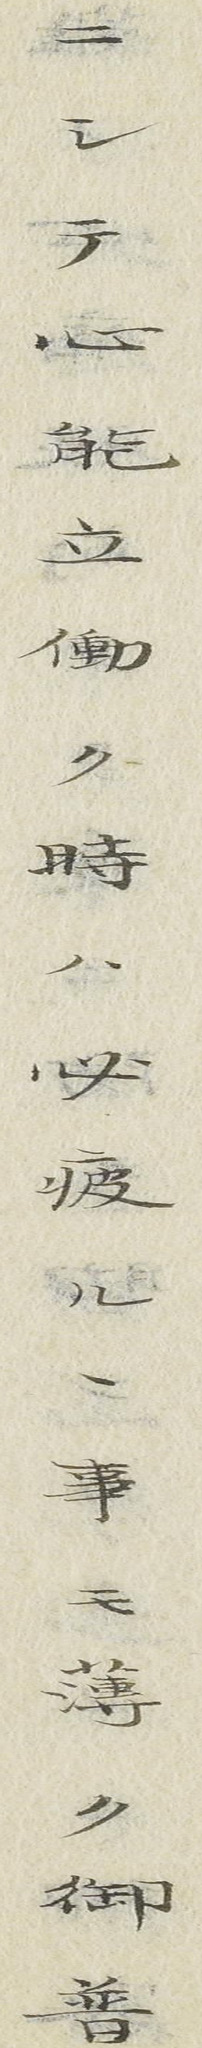ニシテ心能立働ク時ハ必疲ルヽ事モ薄ク御普
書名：地災撮要　地震之部　巻ノ二
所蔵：東京大学地震研究所図書室 Earthquake Research Institute Library, The University of Tokyo, JAPAN
